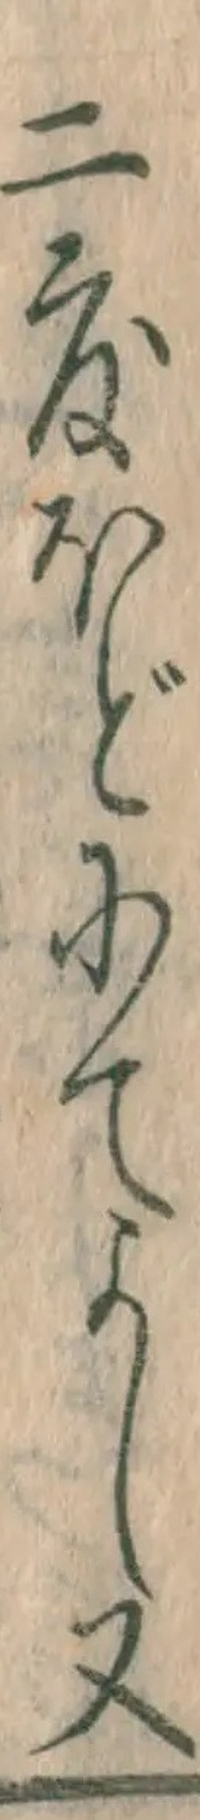二度ほどにてよし又
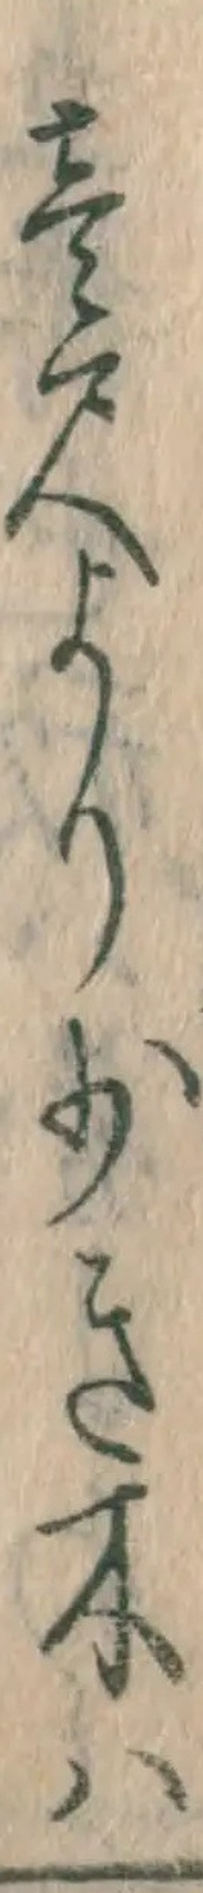壱尺より少き木は
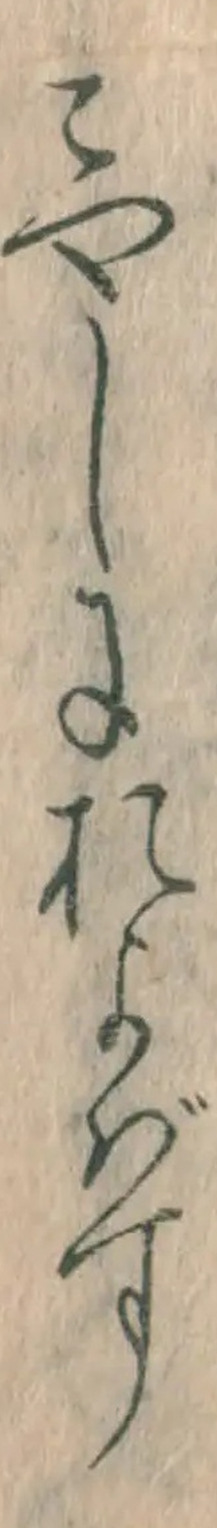こやしにおよばす

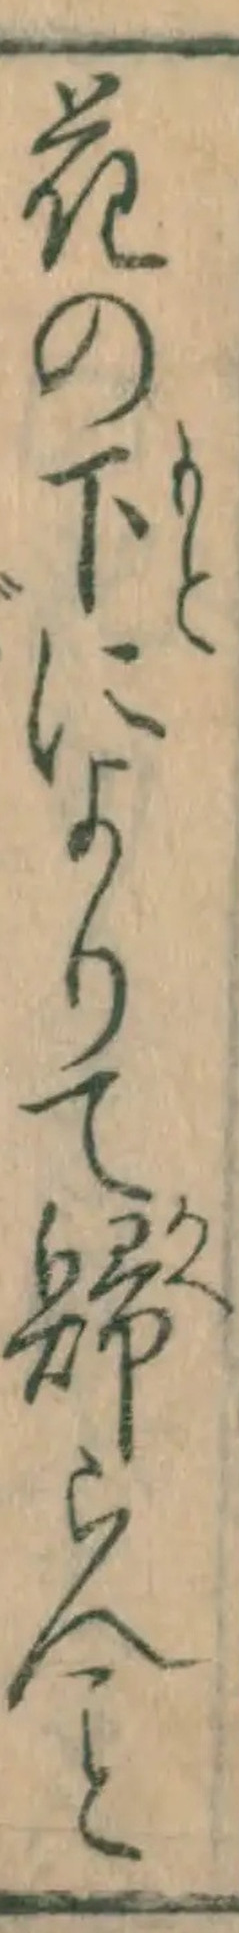花の下によりて帰らんこと
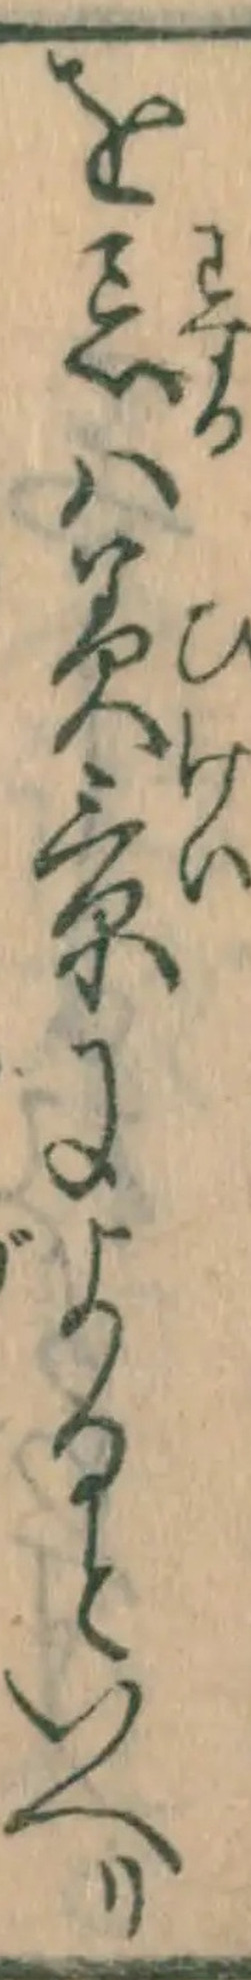を忘は美景によるといへ
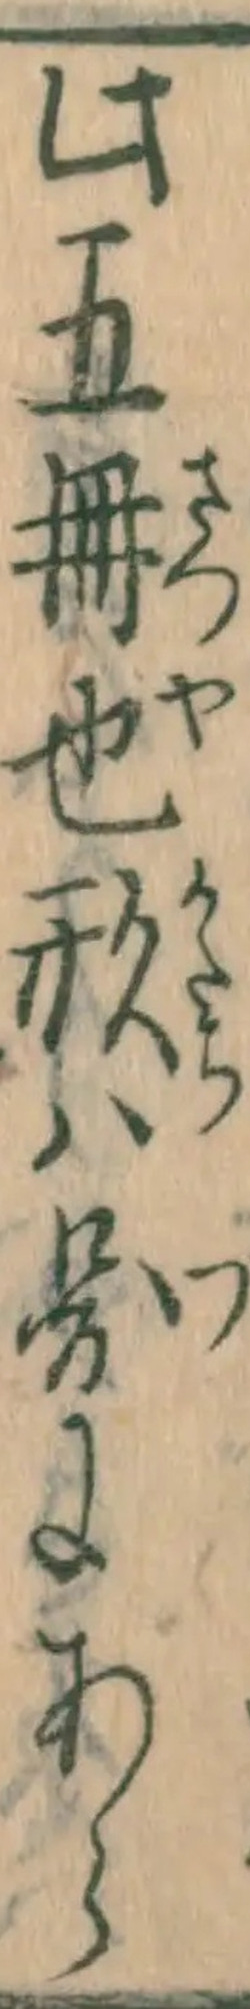此五冊也形は図にあら
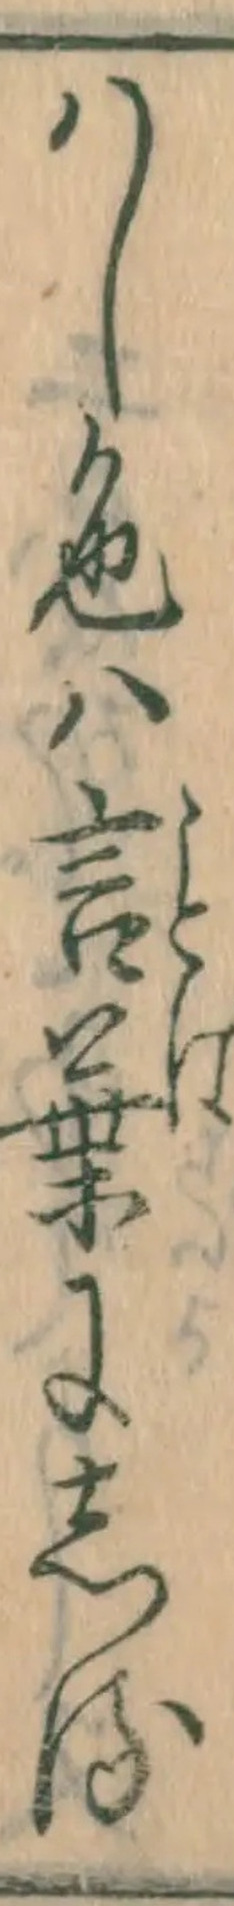はし色は言葉にしる
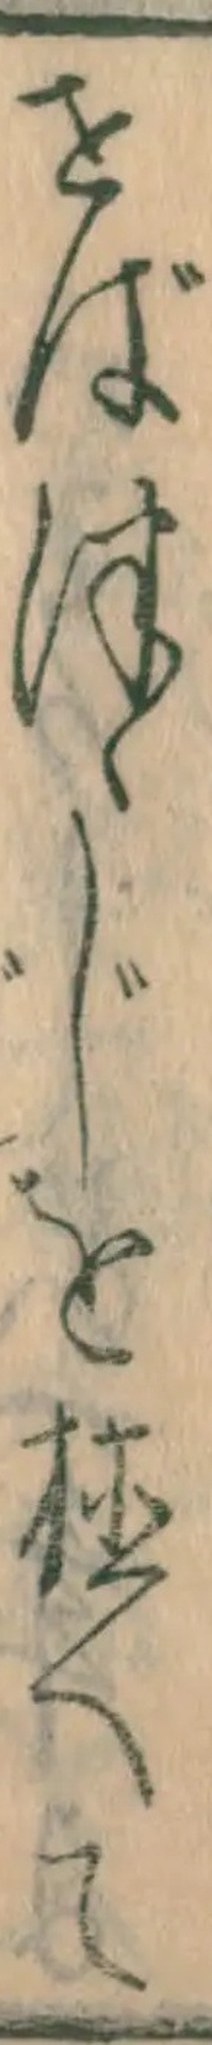せばつゝじを植へて
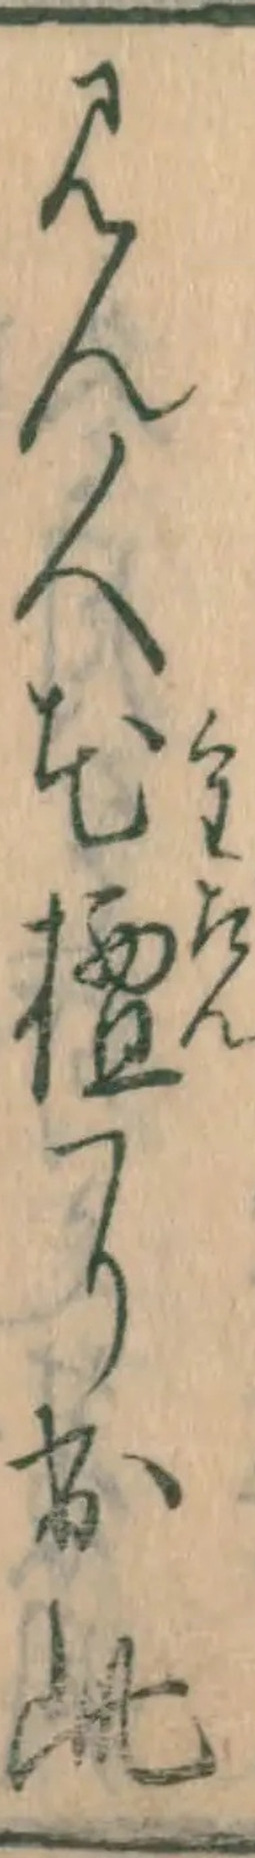見ん人花檀に出此
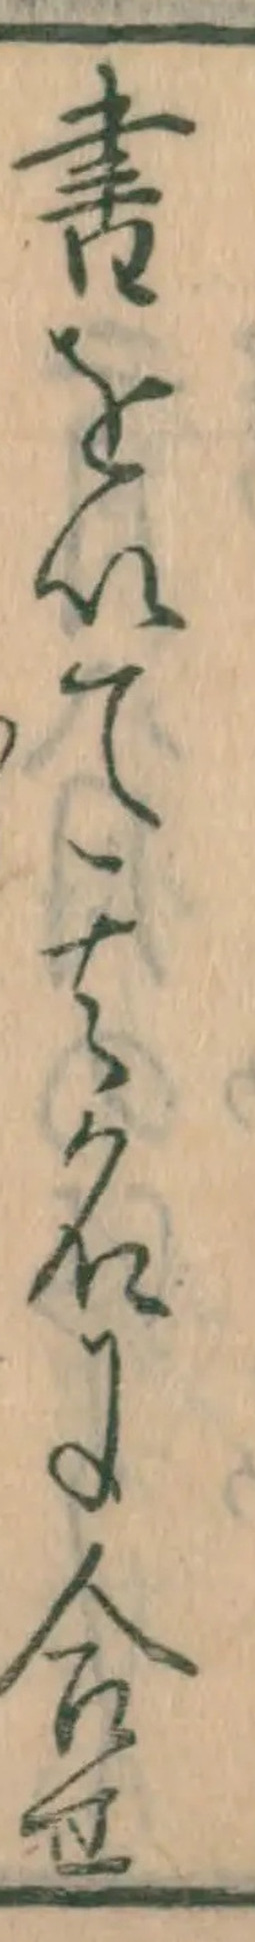書を以て其名に合せ
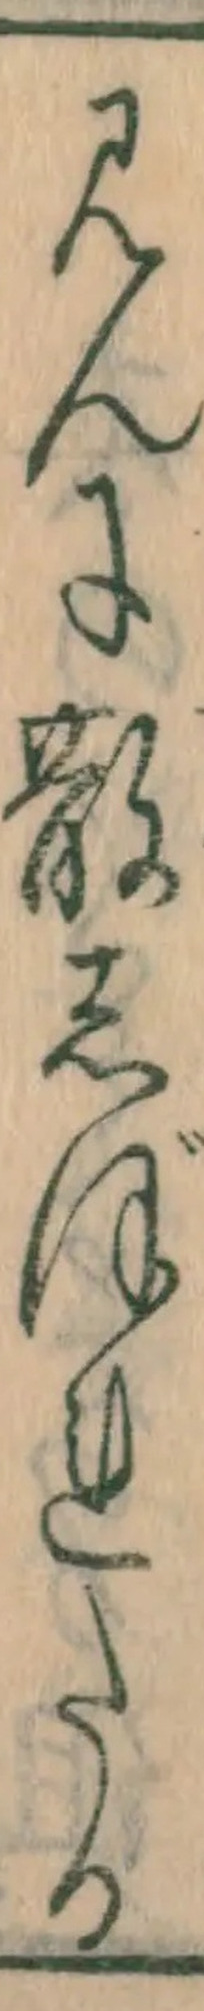見んに散しぼれたる
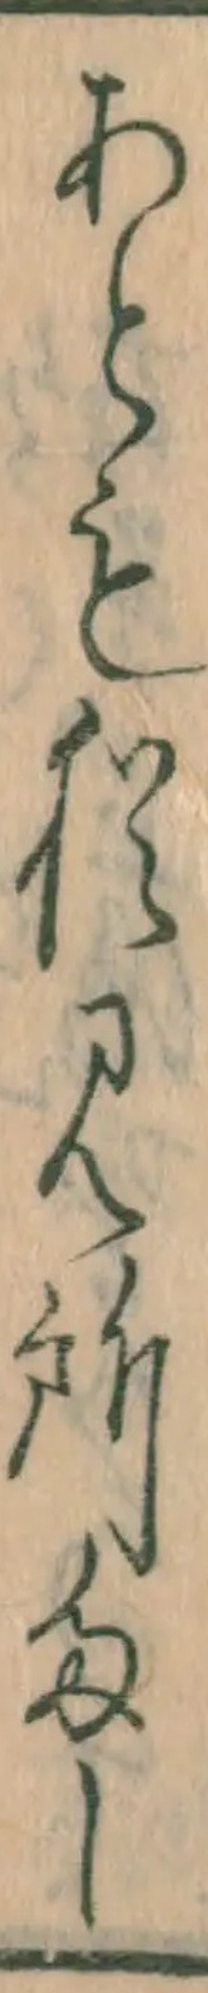あとも猶見所多し
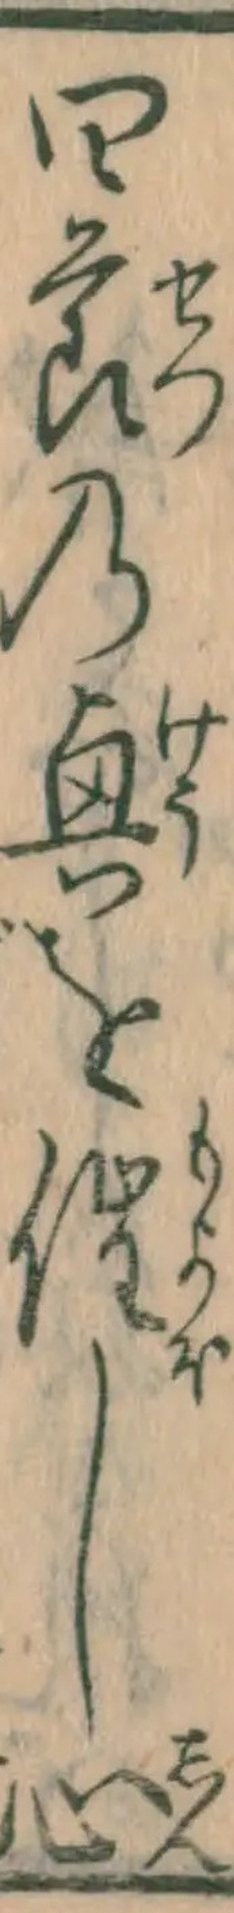四節の興を催し心
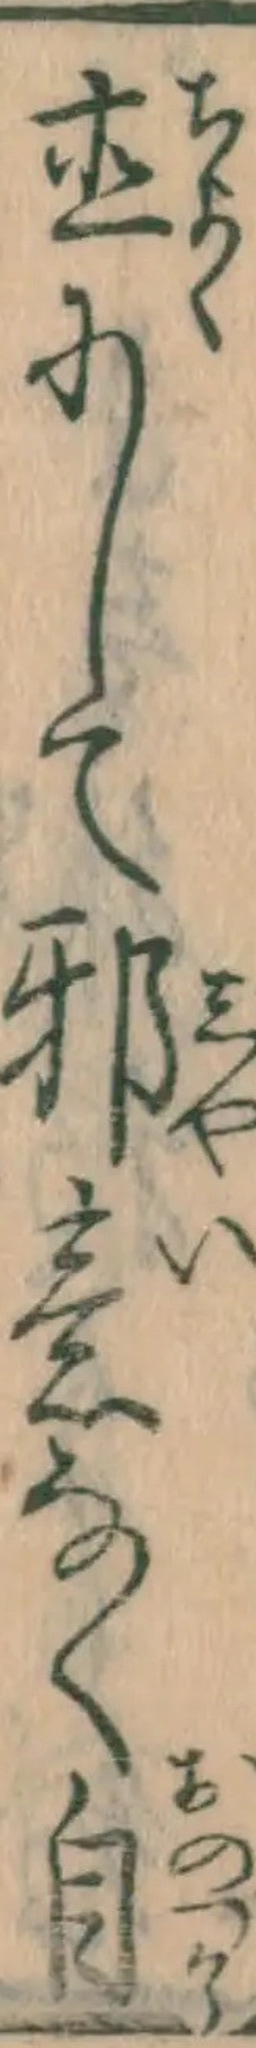直にして邪意なく自
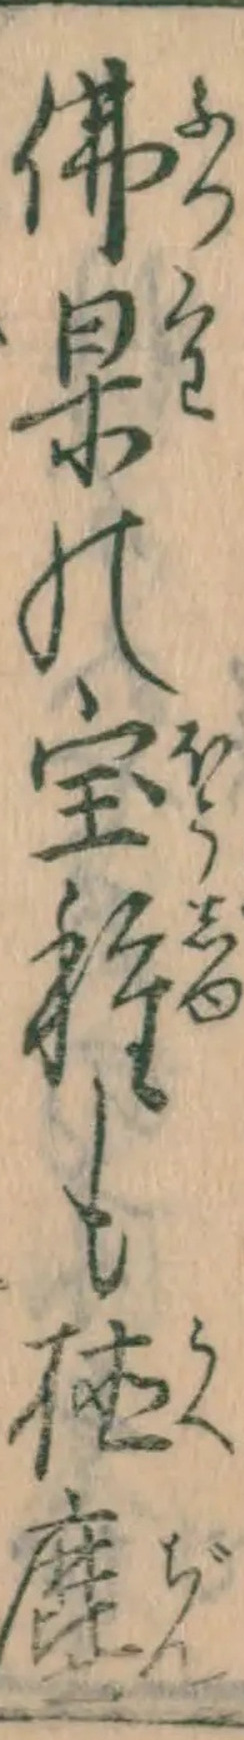佛果の宝種も植塵
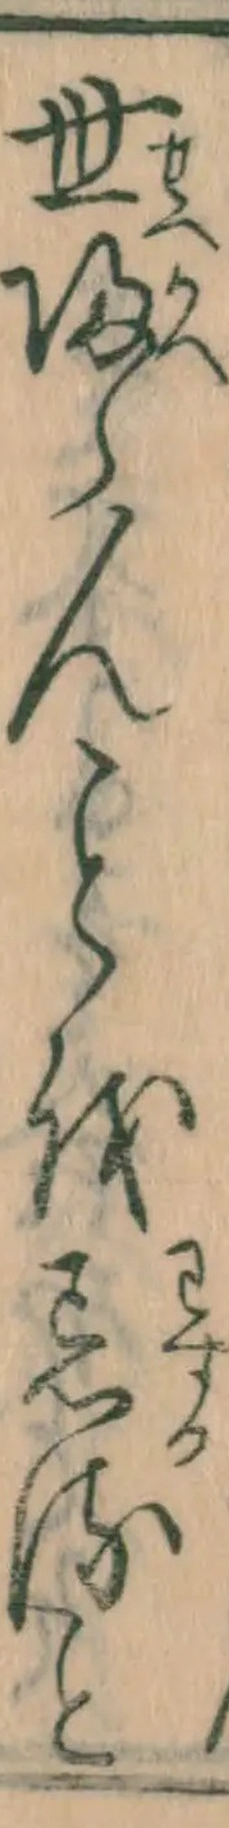世帰らんことを忘ること
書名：錦繍枕 5巻. [5]
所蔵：国立国会図書館 National Diet Library, JAPAN
